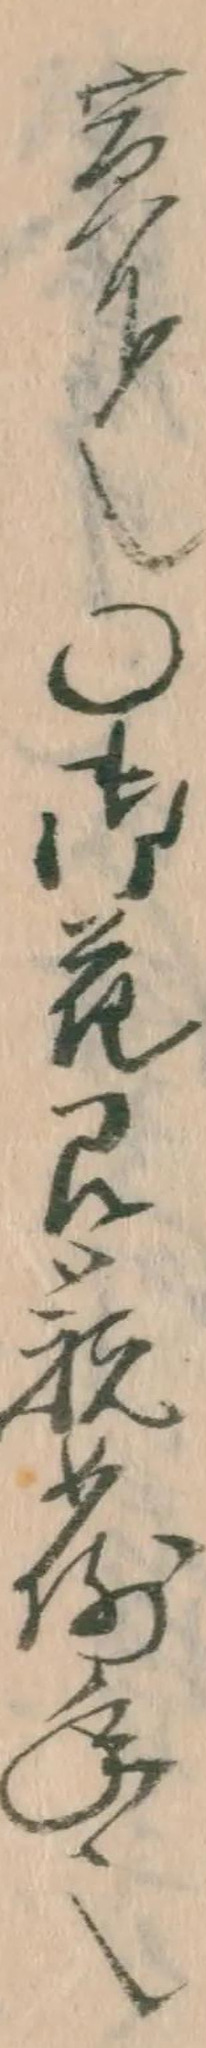宣下也○御花見御祝如例年也
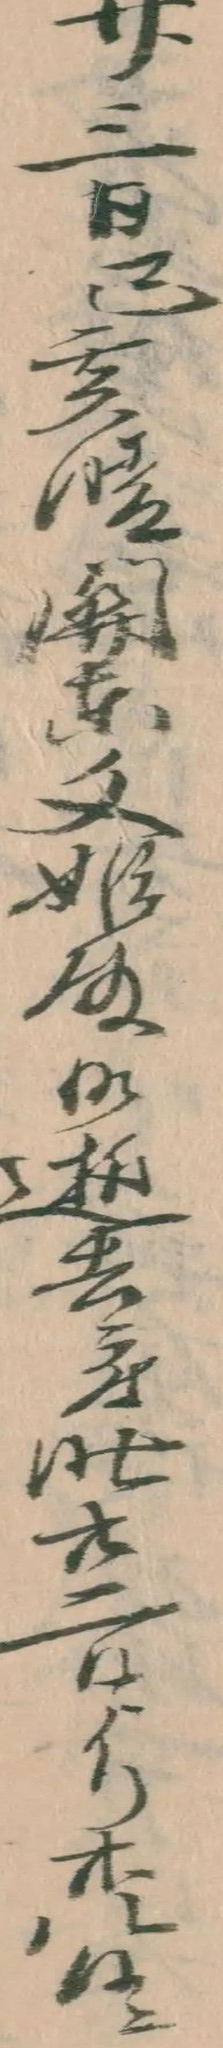廿三日己亥晴関東文姫殿御逝去ニ付昨廿二日より廿八日ニ
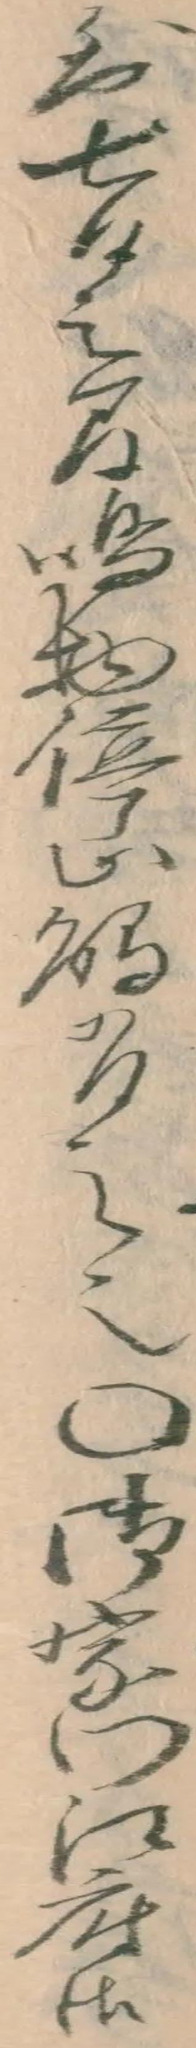至七日之間鳴物停止觸有之也○御家門江府御
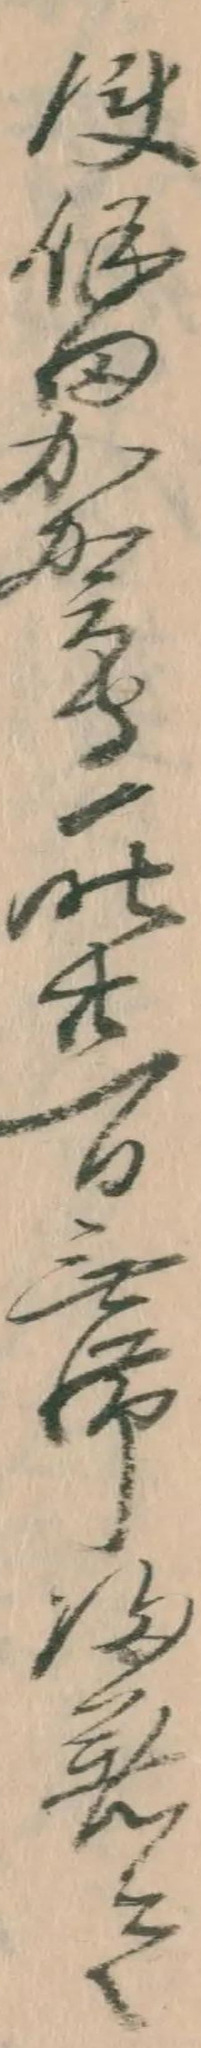使保田加賀守一昨廿一日無滞帰着云々
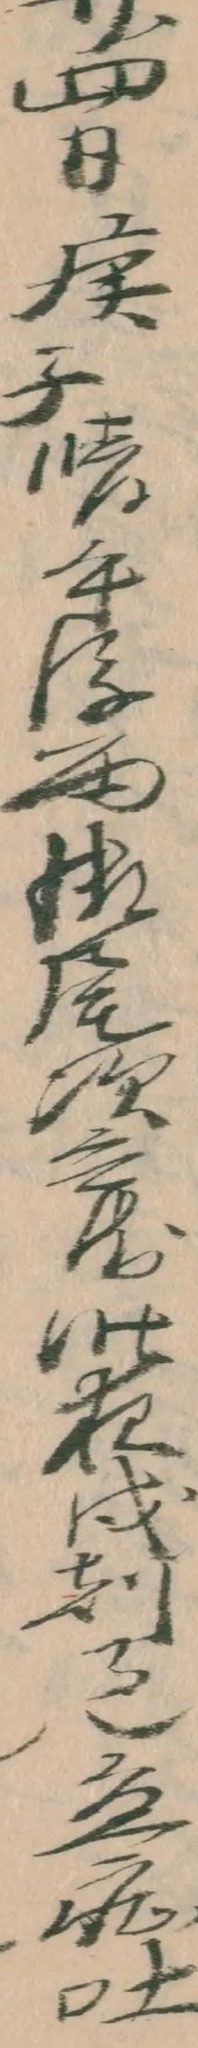廿四日庚子晴午後雨瀬尾次兵衛昨夜戌刻過飛吐
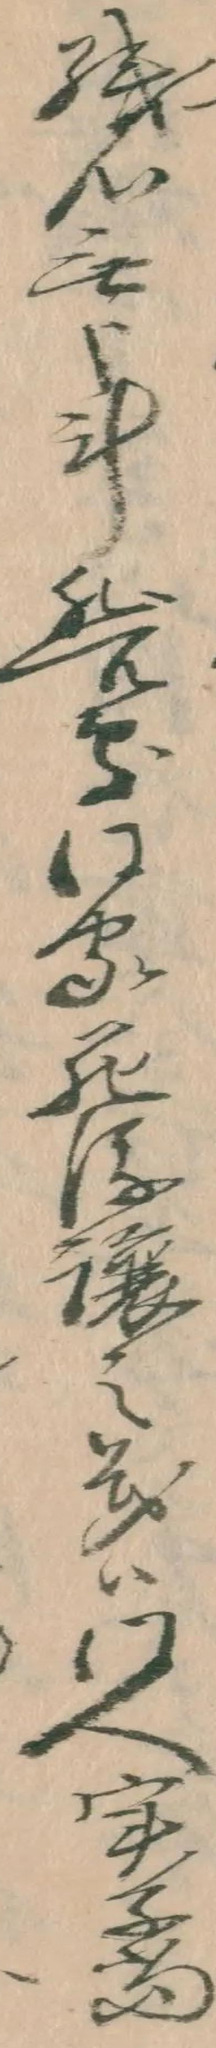残心無申斗然ル處同家死後譲之義ハ門人実子當
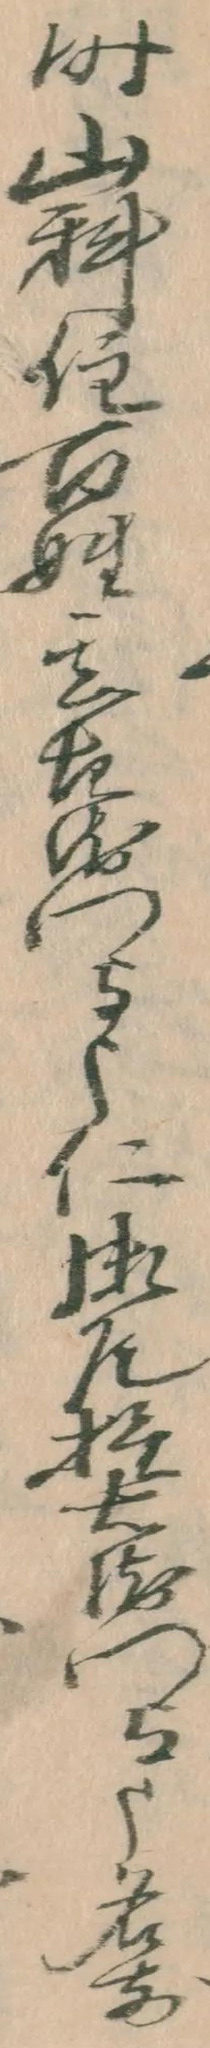時山科住百姓甚左衛門と申仁瀬尾権右衛門与申名前
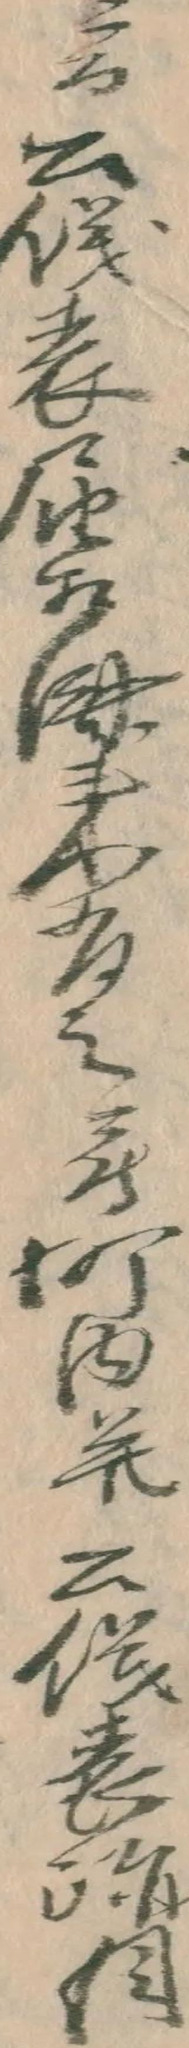二而公儀表届相済来有之二付町内并公儀表跡目
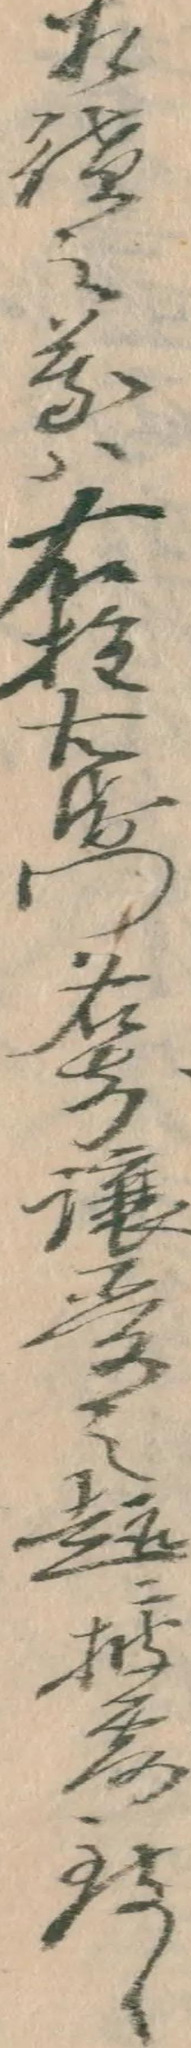相續之義ハ右権右衛門名前譲受之趣ニ披露致し
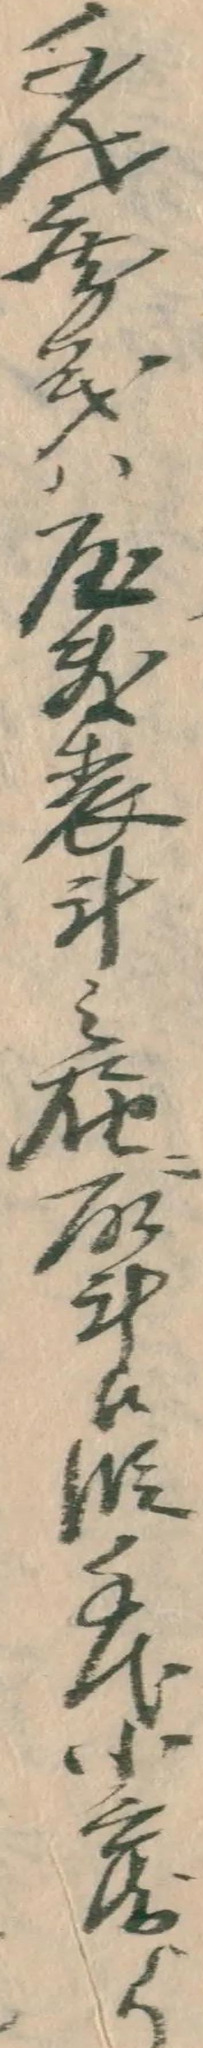千代蔵義ハ屋敷表斗之届取ニ取斗候段手代小兵衛より
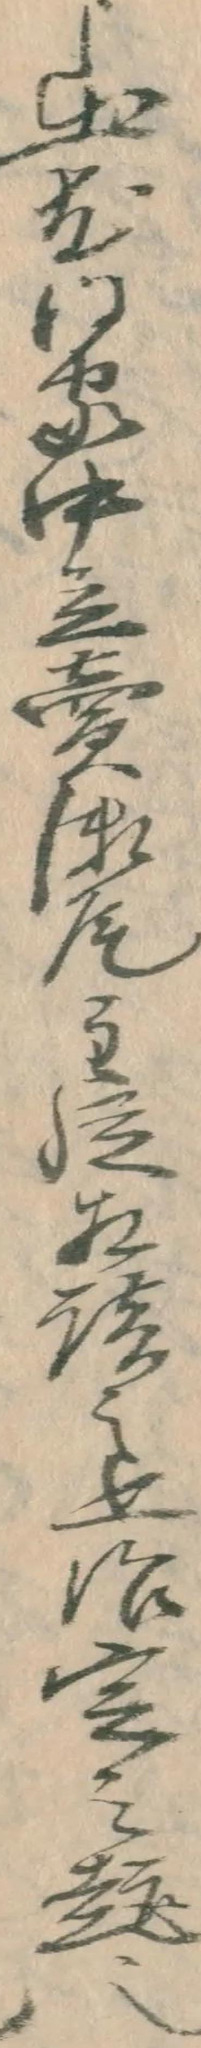申出尤同家中立賣瀬尾主従相談之上治定之趣也
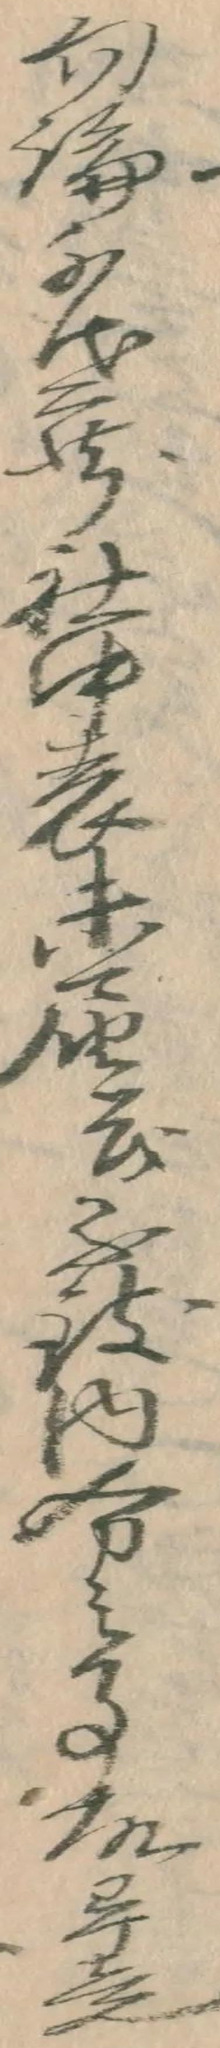勿論千代蔵社中表未届も不致内分之事故畢竟
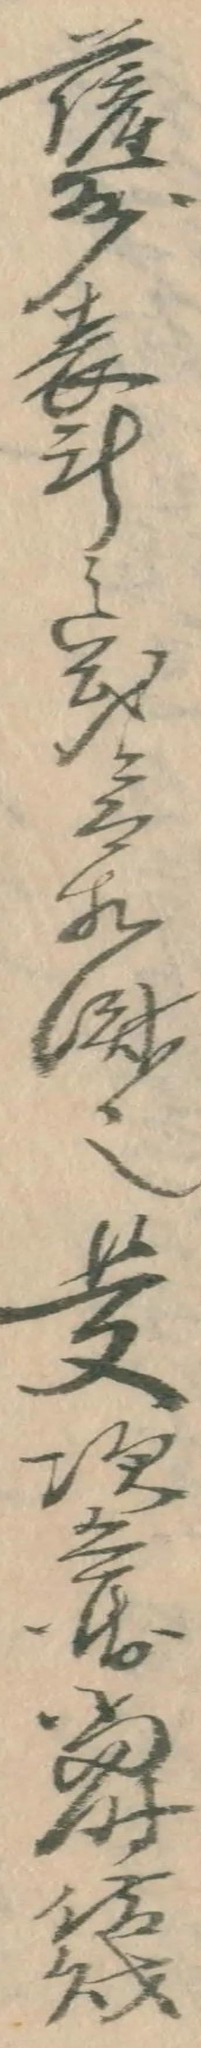薩州表斗之義ニ而相済也且又次兵衛當時借財
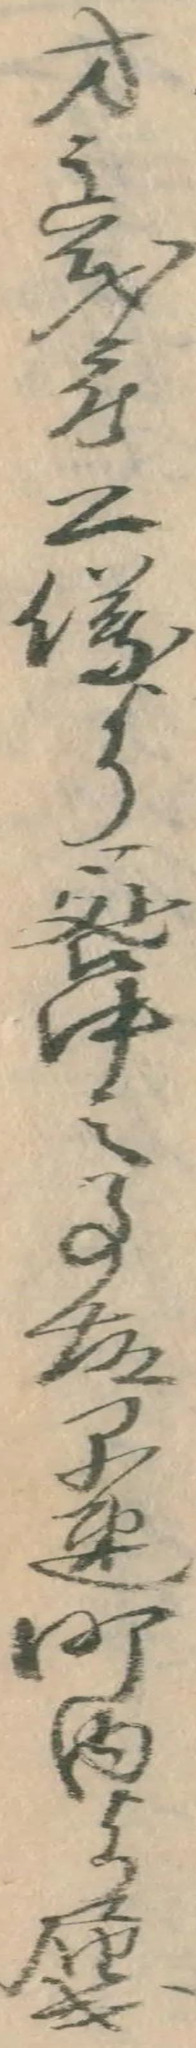方之義ニ付公儀より咎中之事故早速町内より届出

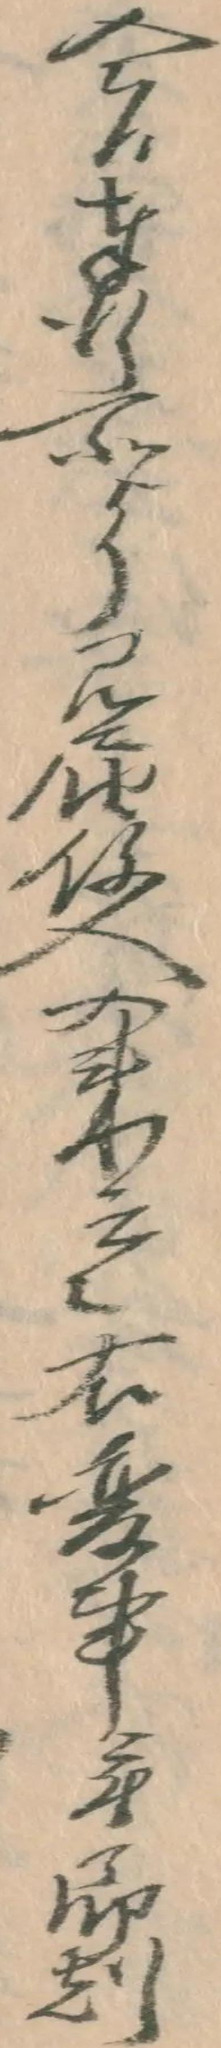今日奉行所より見届役人入来云〻右変事ニ付即刻
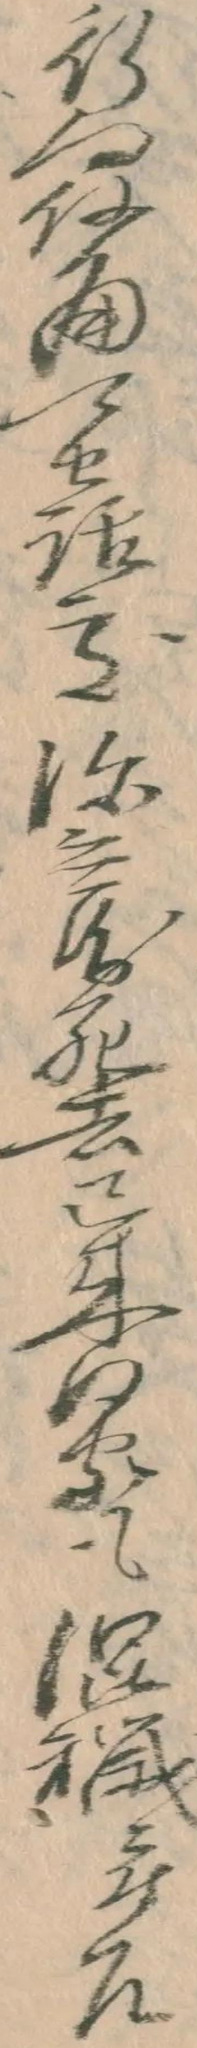行向何角可世話處弥兵衛死去已来同家も混穢ニ付乍
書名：賀茂社記録. 第67冊
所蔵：国立国会図書館 National Diet Library, JAPAN
